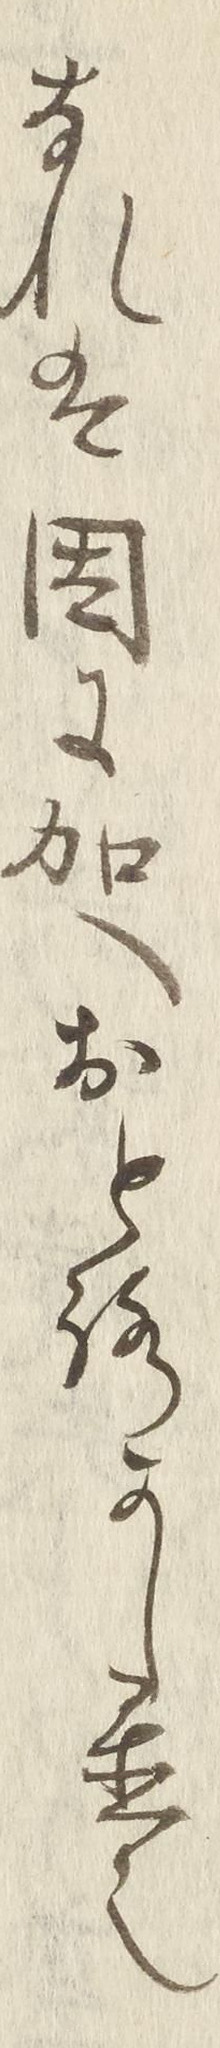なれは因に加へおとろかし置也
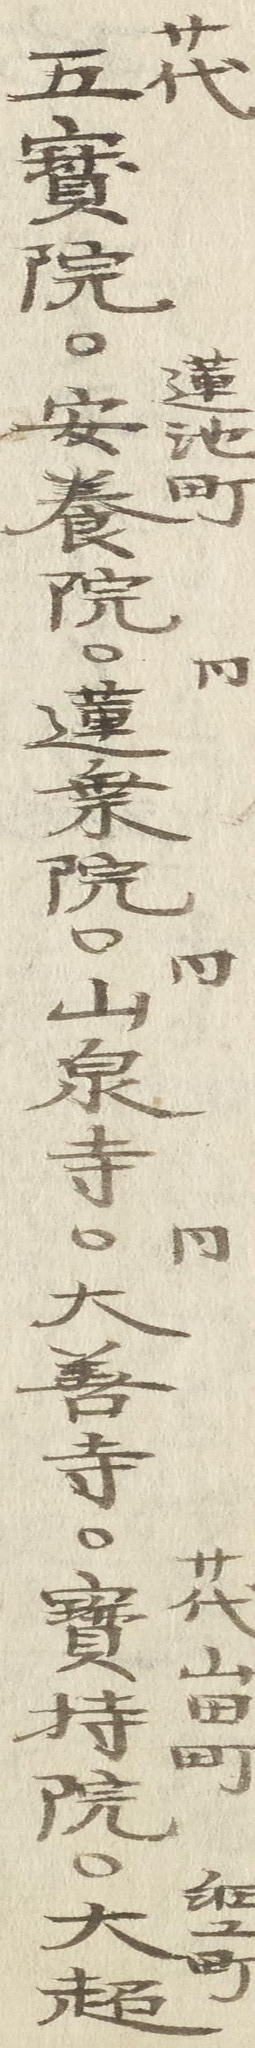五宝院◦安養院◦蓮乗院◦山泉寺◦大善寺◦宝持寺◦大超
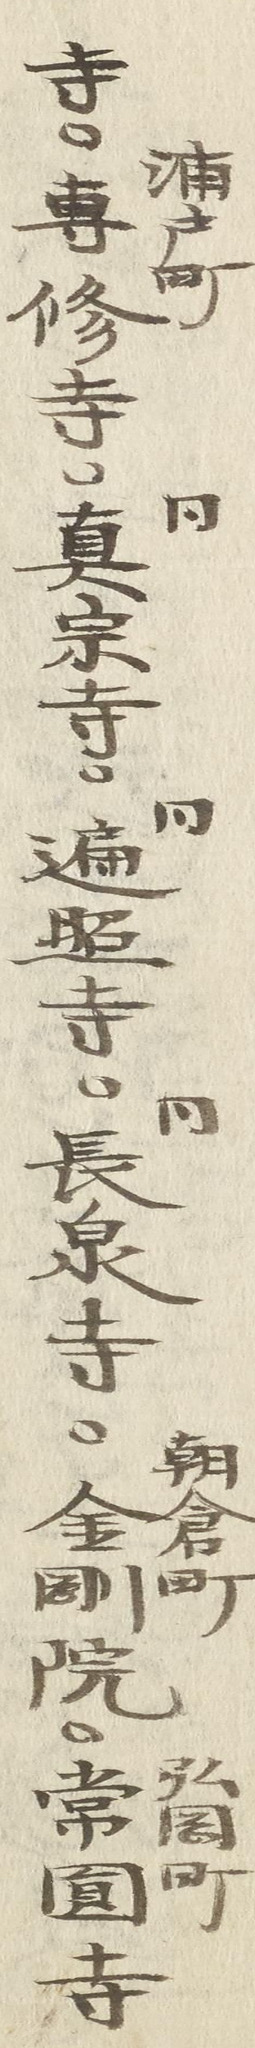寺◦専修寺◦真宗寺◦遍照寺◦長泉寺◦金剛院◦常円寺
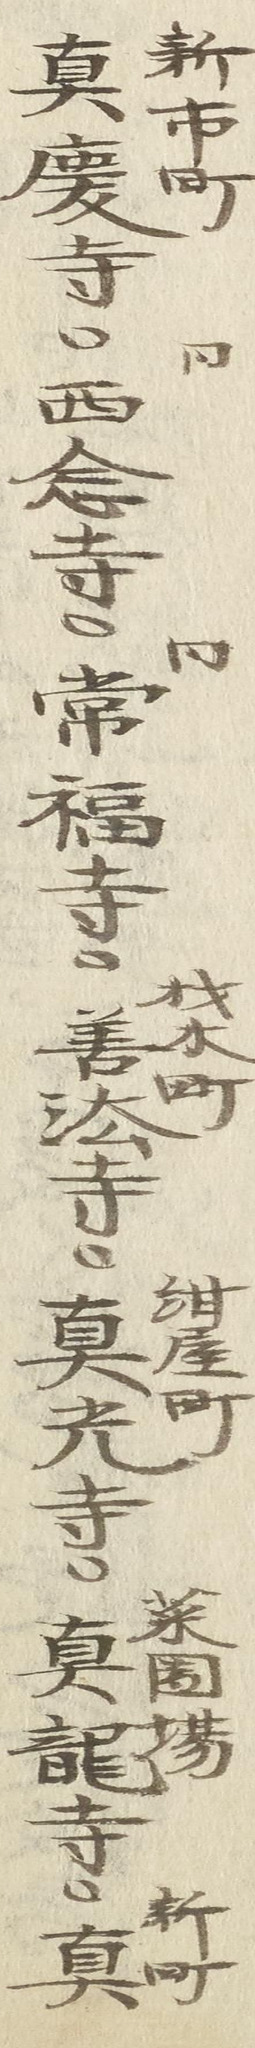真慶寺◦西念寺◦常福寺◦善法寺◦真光寺◦真龍寺◦真
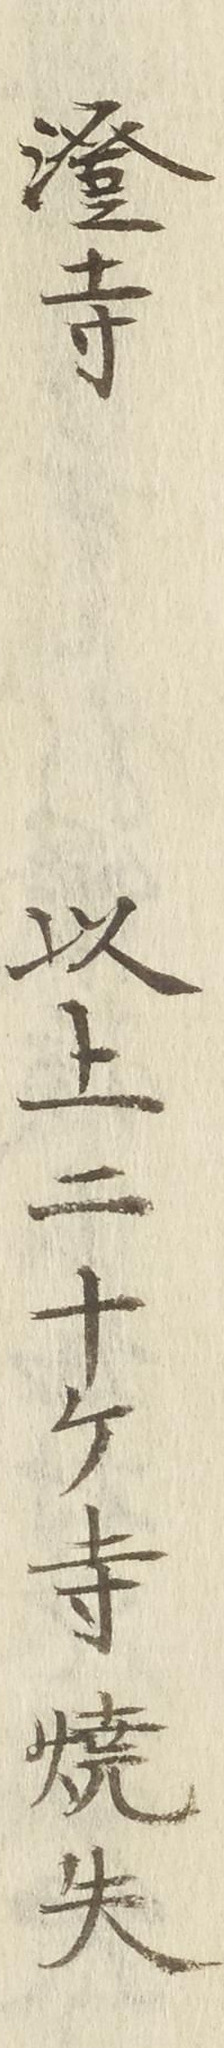澄寺以上二十ケ寺焼失

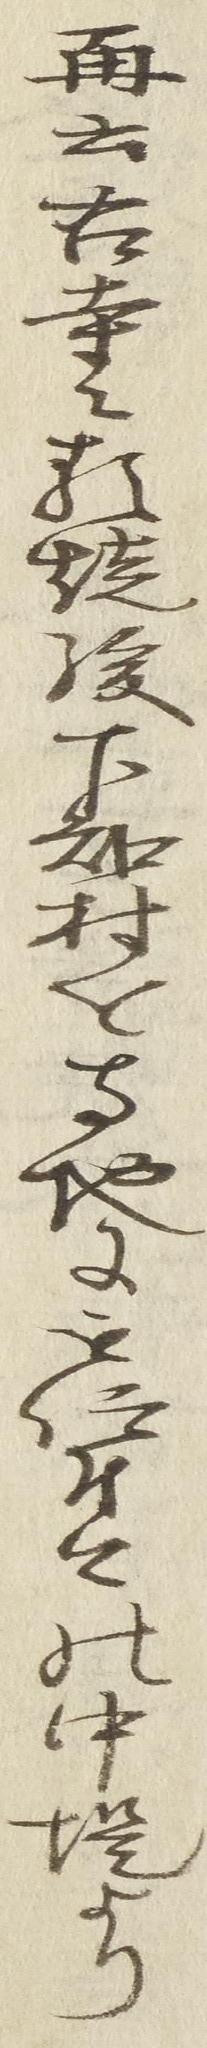再云古寺々類焼後下知村を寺地に被仰付今の中堤より
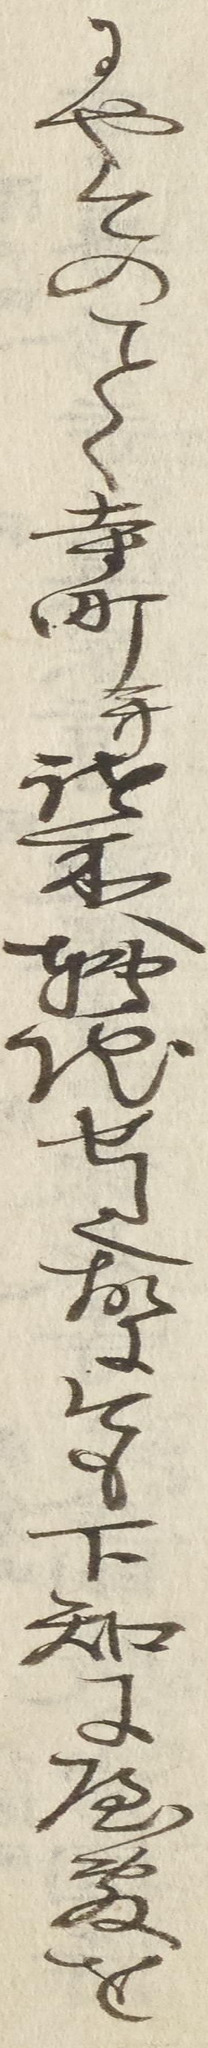にや今のことく寺町幷諸所へ転地せし也故に今も下知に屋敷を
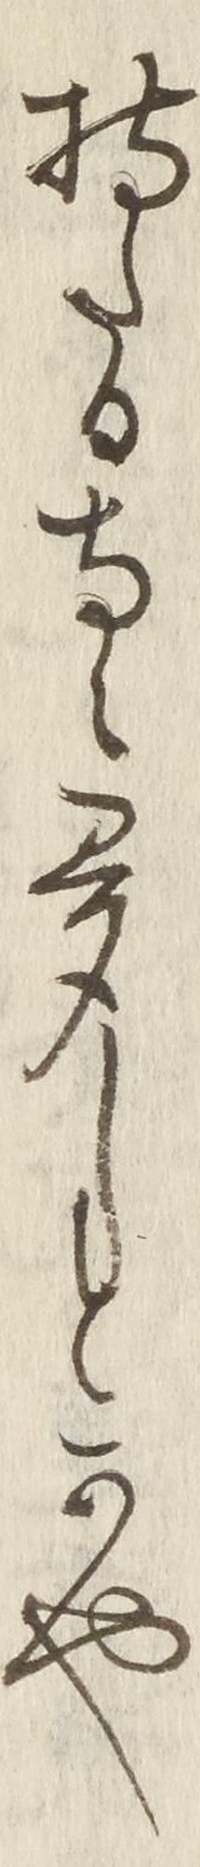持たる寺々多しとかや
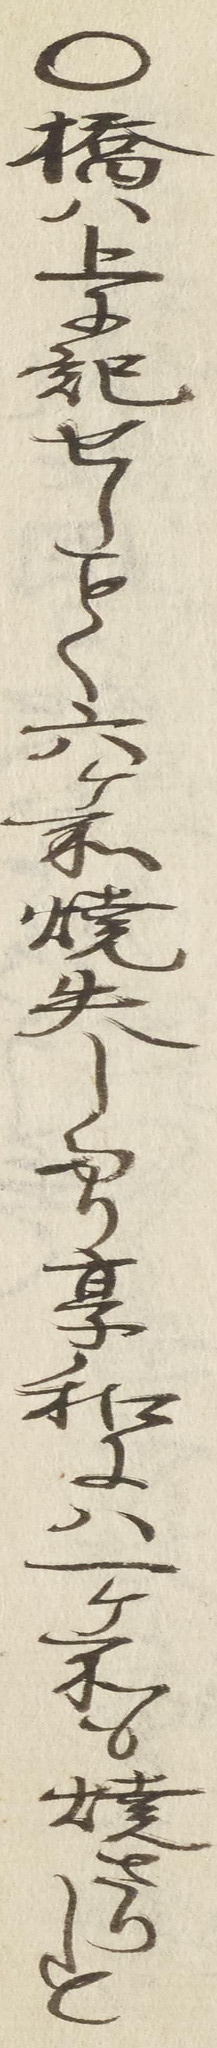〇橋は上に記せしことく六ケ所焼失したり享和には一ケ所も焼さりしと
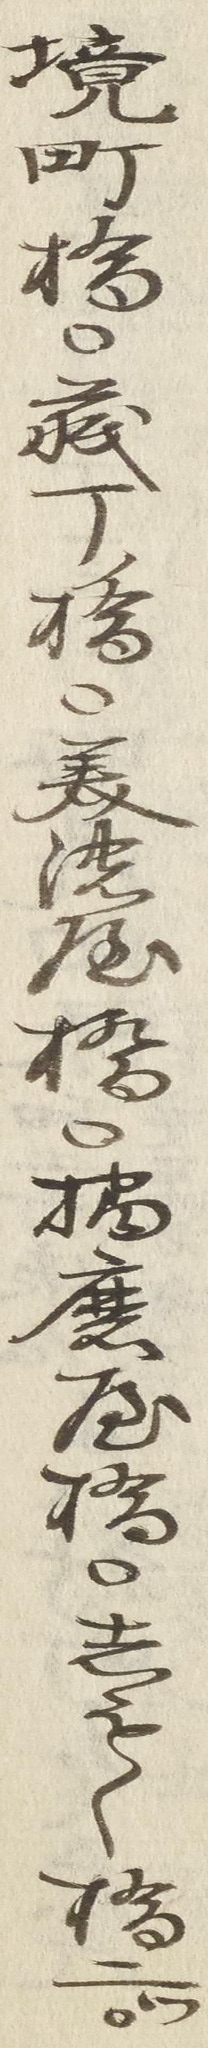境町橋◦蔵丁橋◦美濃屋橋◦播磨屋橋◦しもく橋二ツ◦
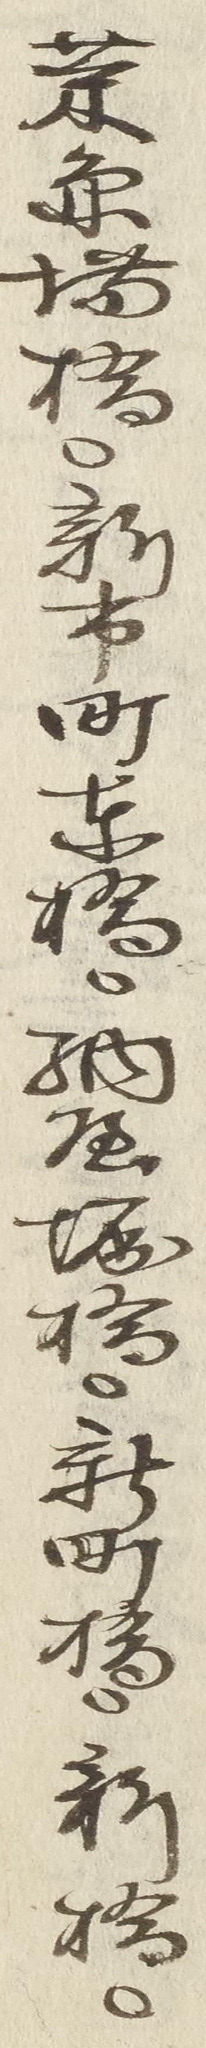菜円場橋◦新市町東橋◦納屋堀橋◦新町橋◦新橋◦
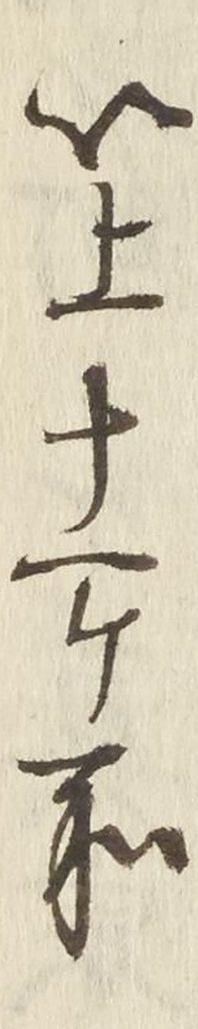以上十一ケ所
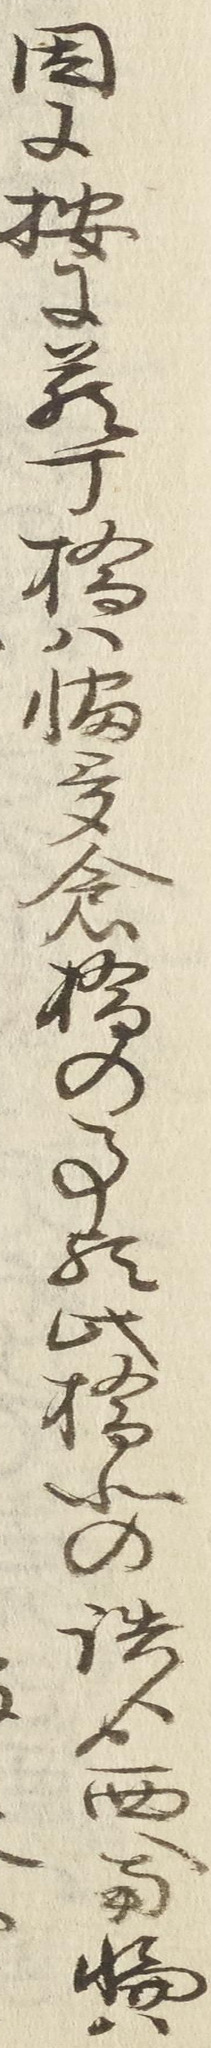因に按に蔵丁橋は幡多倉橋の事歟此橋北の詰より西へ南輪は
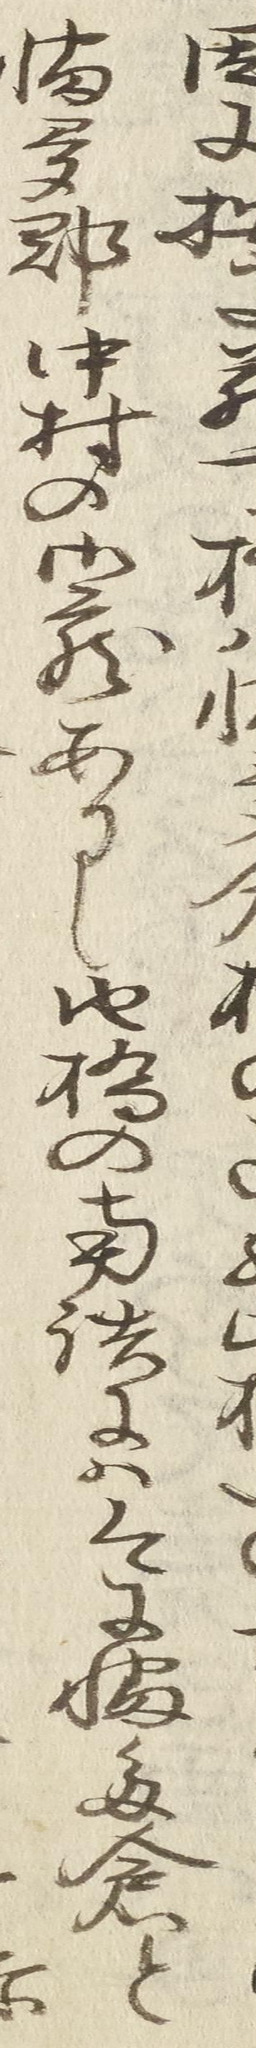幡多郡中村の御蔵ありし由橋の南詰には今に幡多倉と
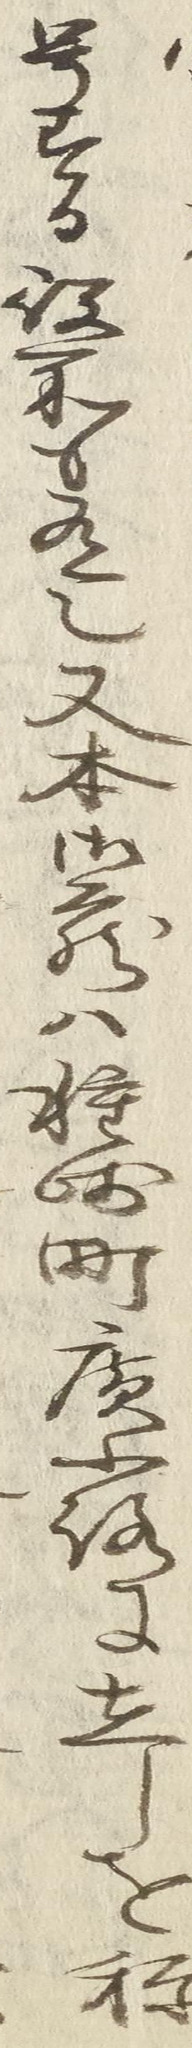号する役所も有也又本御蔵は種崎町広小路に在しを称
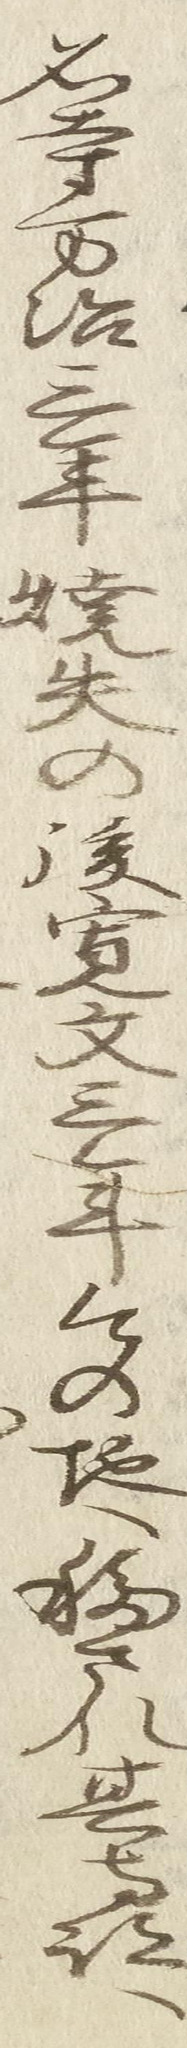名寺万治三年焼失の後寛文三年今の地へ移され其寺跡へ
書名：地震記　上
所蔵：東京大学地震研究所図書室 Earthquake Research Institute Library, The University of Tokyo, JAPAN
